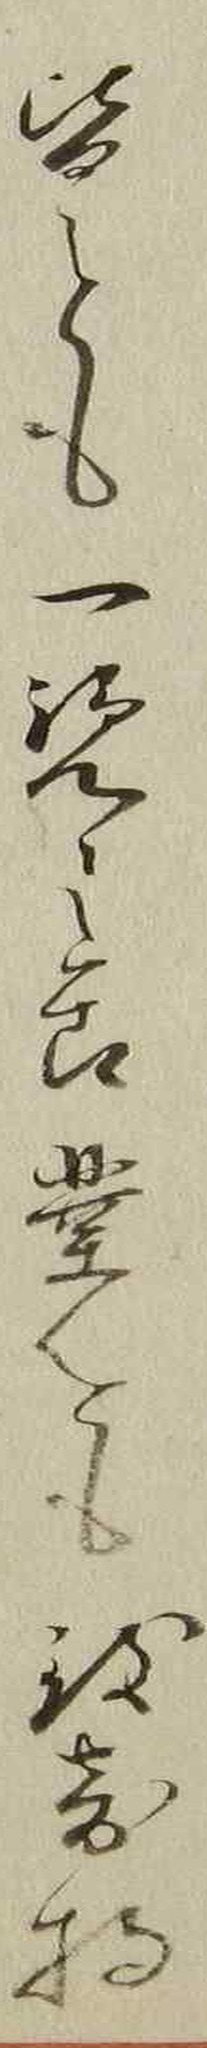皆とも一覧之節業をも致奇特
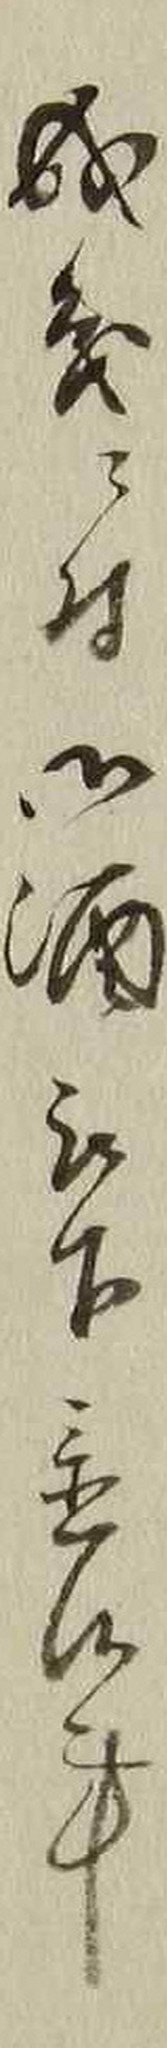成義ニ付御酒被下置候事
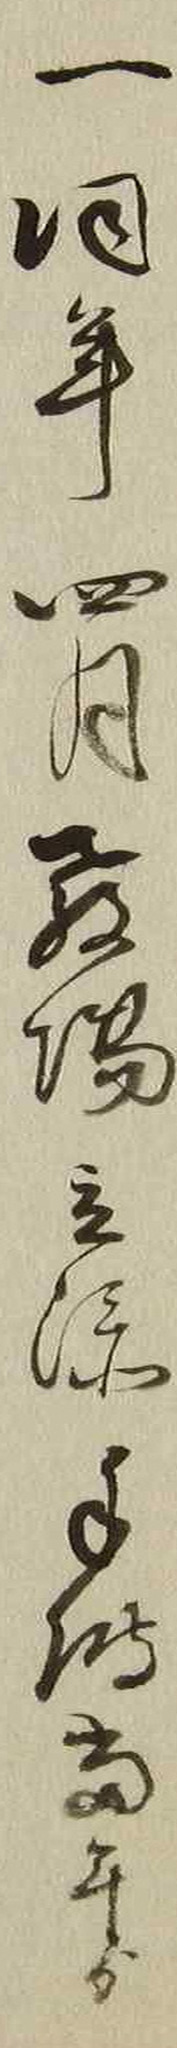一同年四月教場立添手伝当年ゟ
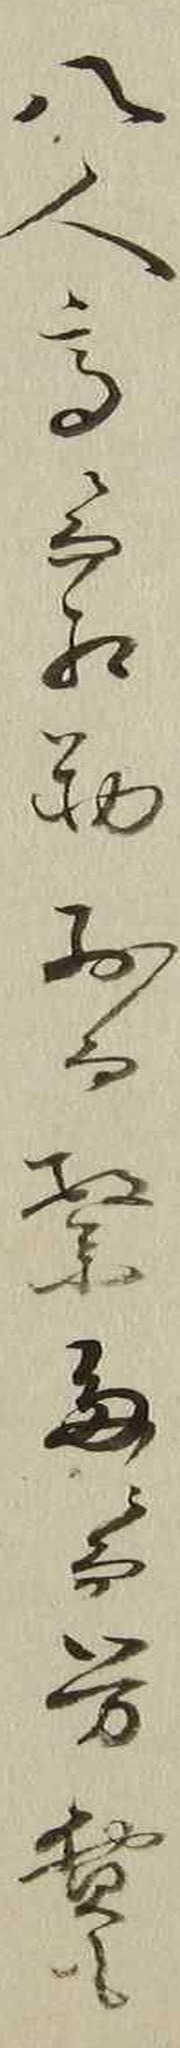八人高ニ而相勤別而繁多ニ而労費も
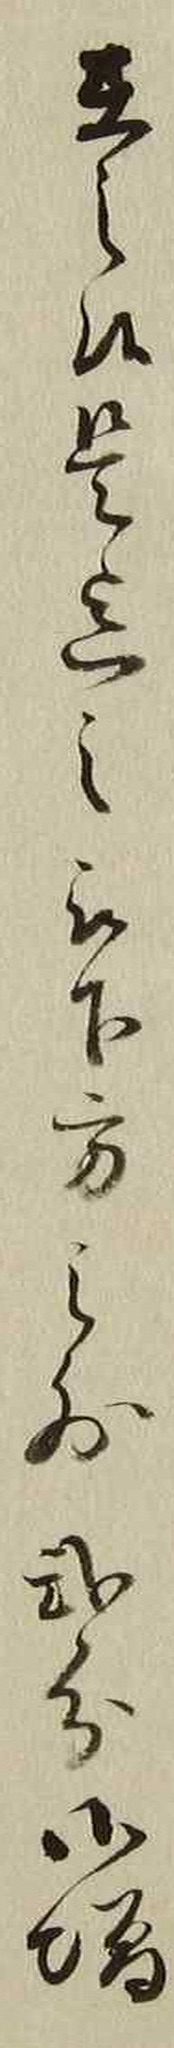在之候是迄之被下方之外弐分御増
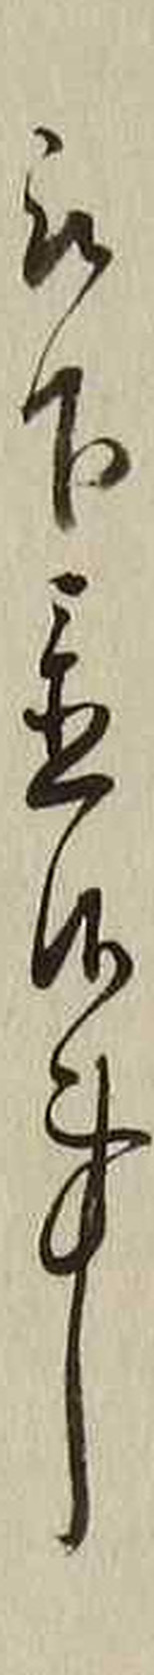被下置候事
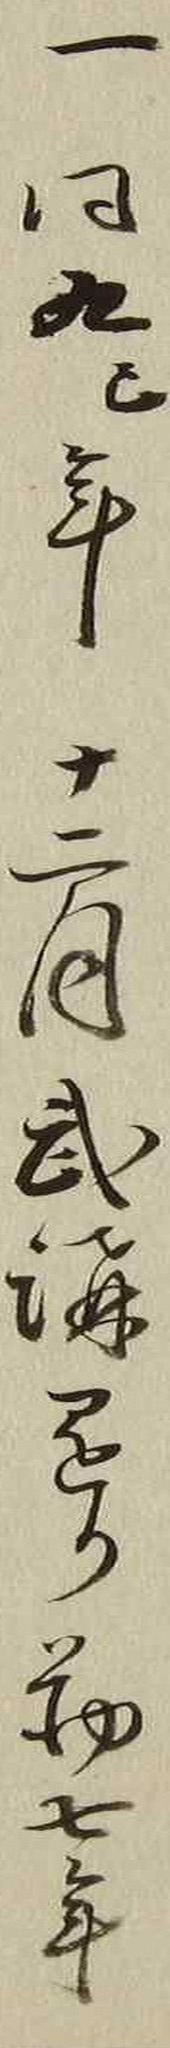一同九巳年十二月武講懸り勤七年
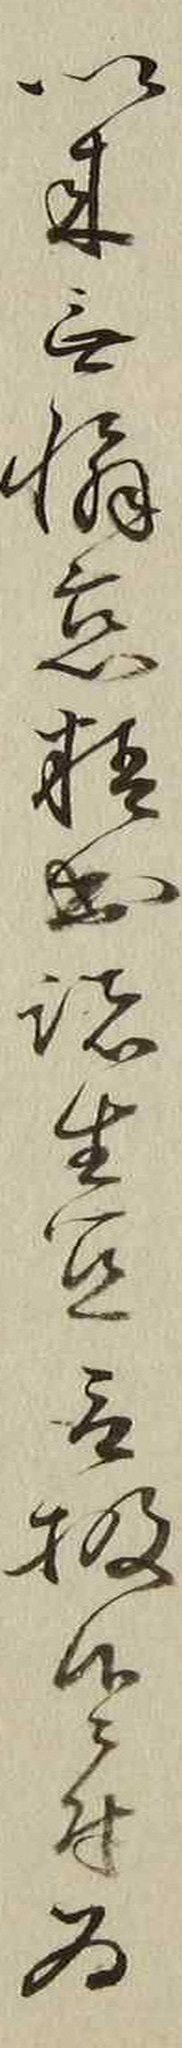以来無懈怠精出諸生宜取扱候ニ付為
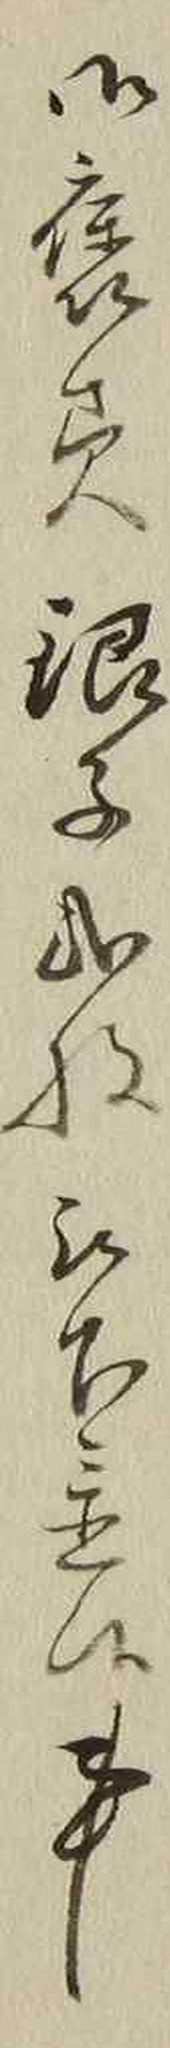御褒美銀子弐枚被下置候事
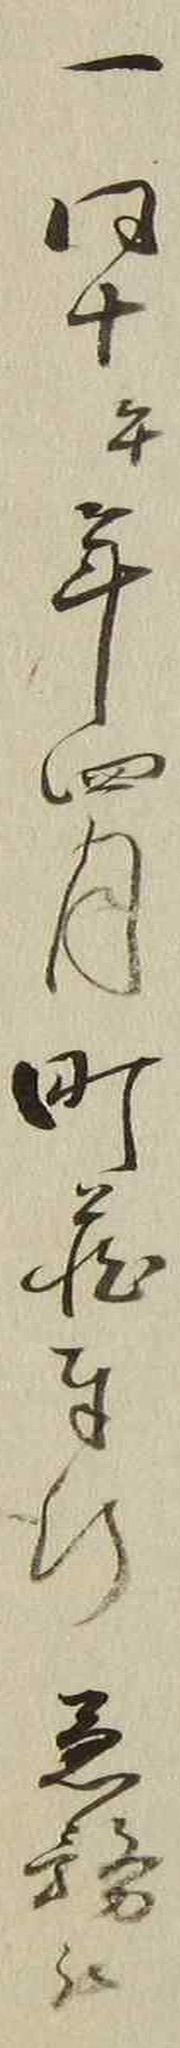一同十午年四月町蔵奉行兼務被
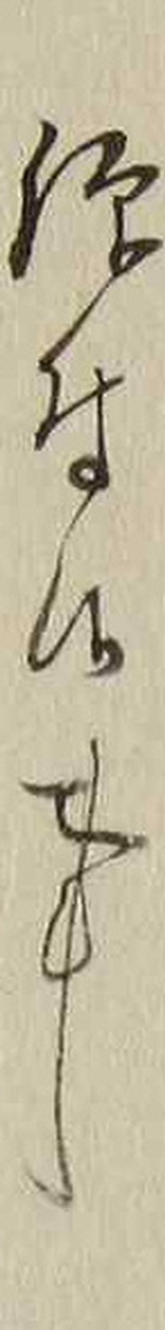仰付候事
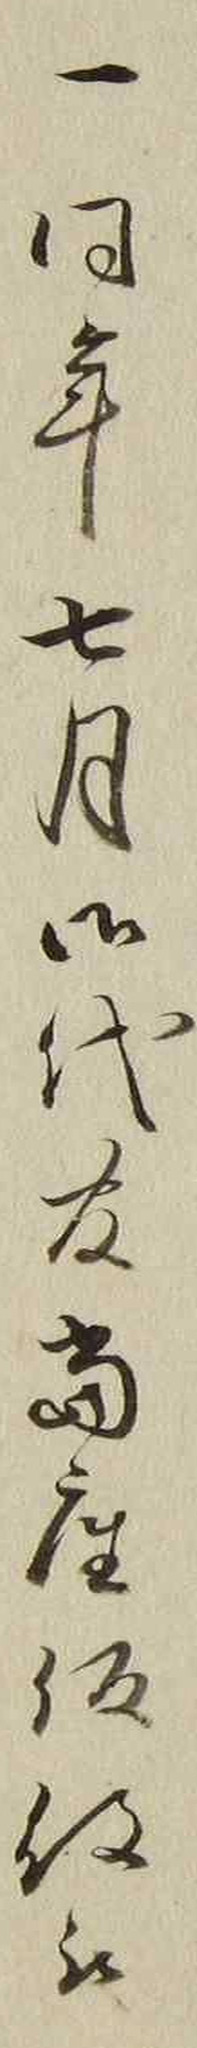一同年七月御代官当座仮役被
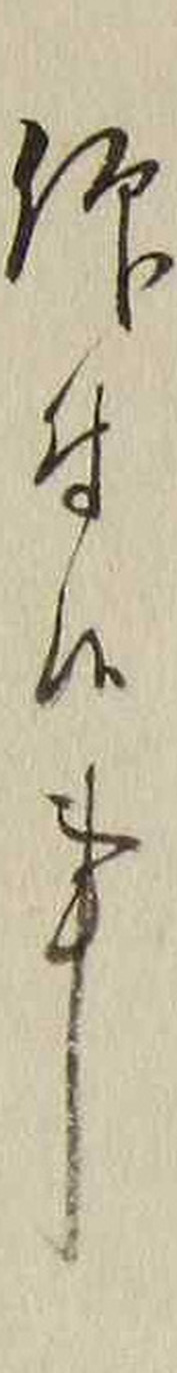仰付候事
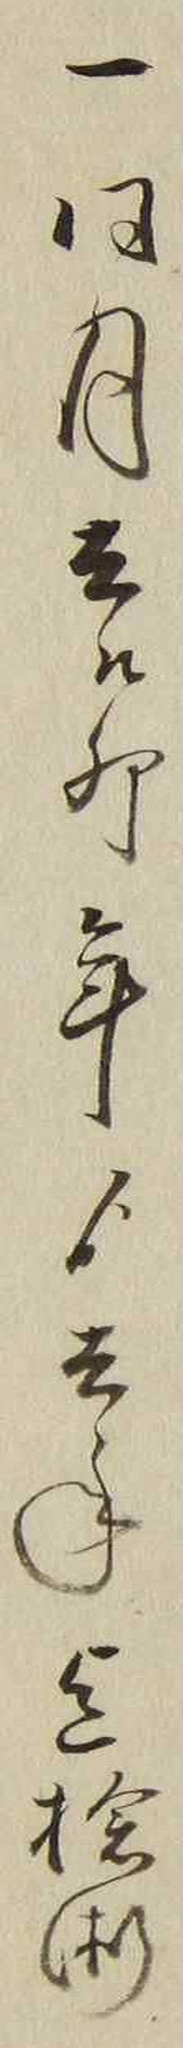一同月去ル卯年ゟ去年迄剣術

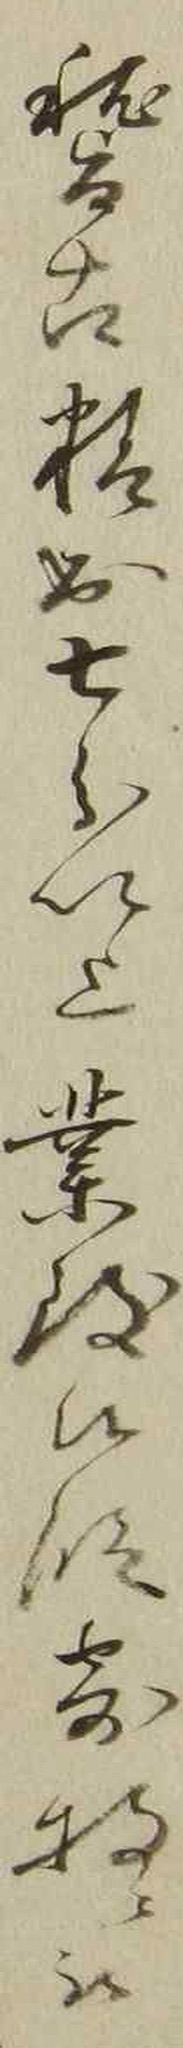稽古精出七分以上業致候段奇特ニ被
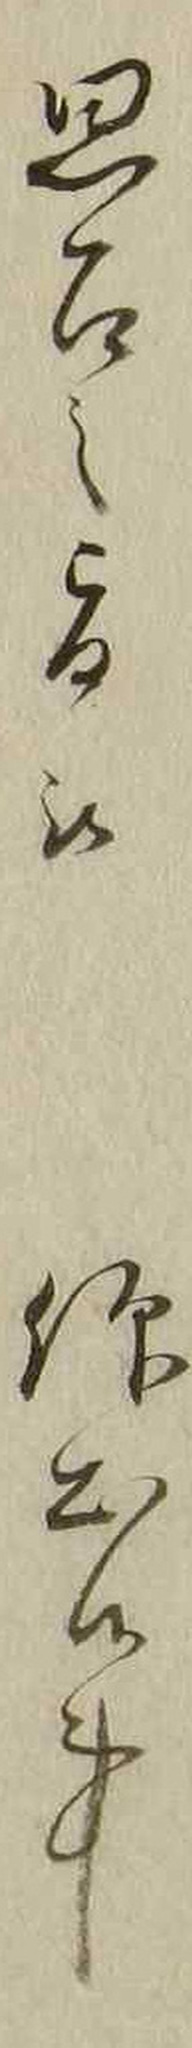思召之旨被仰出候事
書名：諸士系譜　巻之52　に之部3
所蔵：会津若松市立会津図書館
